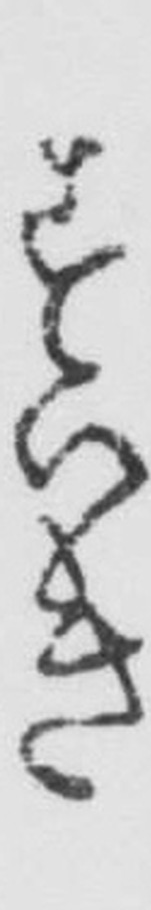すいき
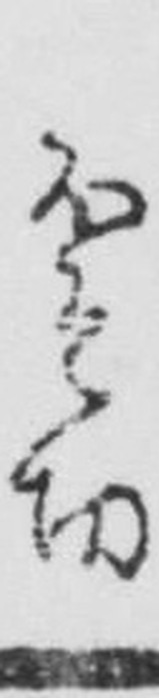ほそ切
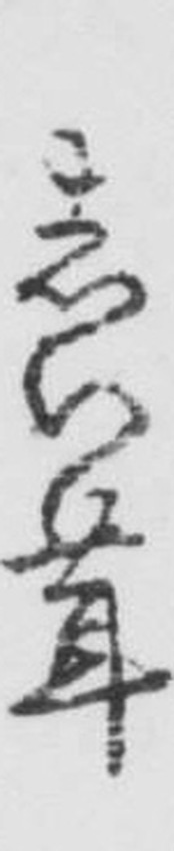しい茸
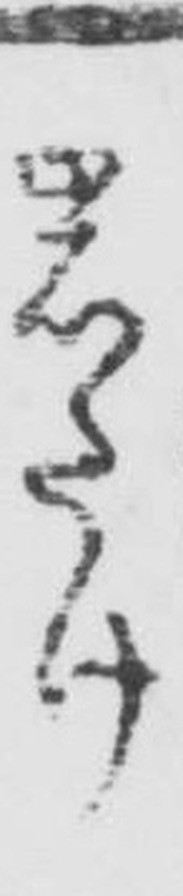岩たけ
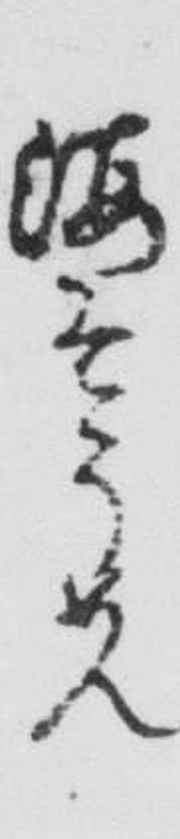海そうめん
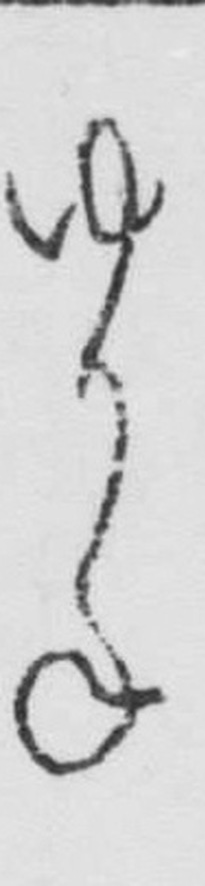ゆりね
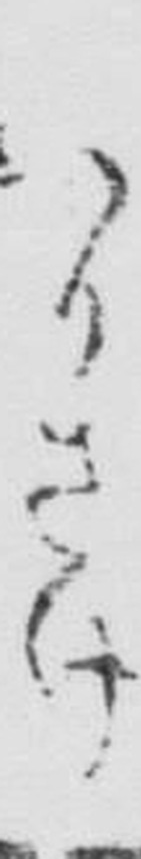いりさけ
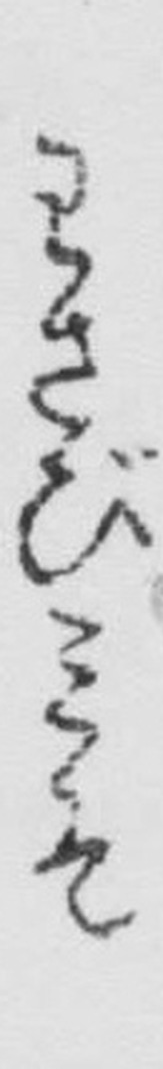わさびみそ
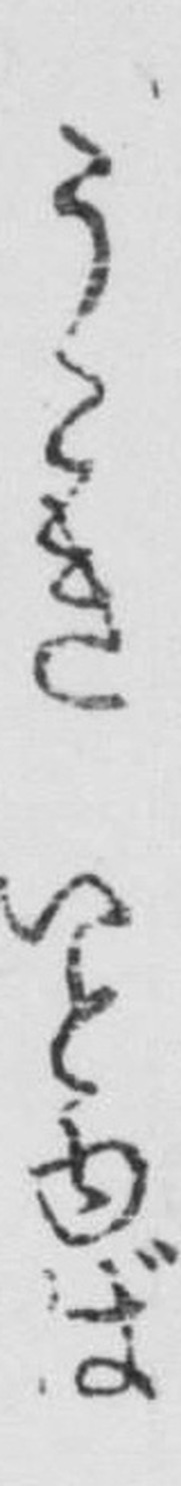うこきいとゆば
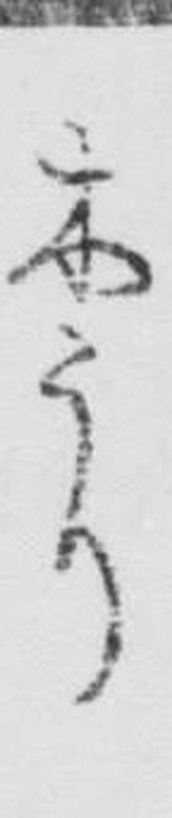白うり
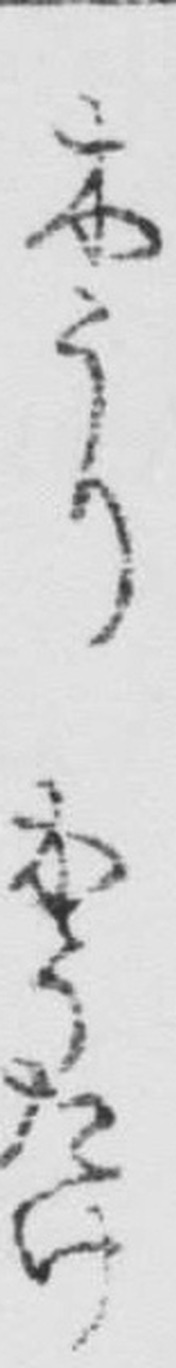木うりかうたけ
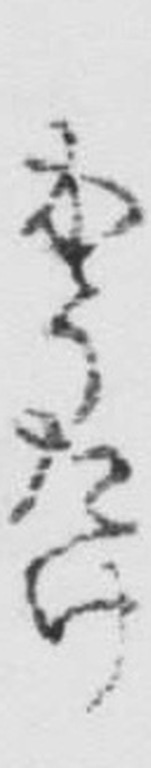かふたけ
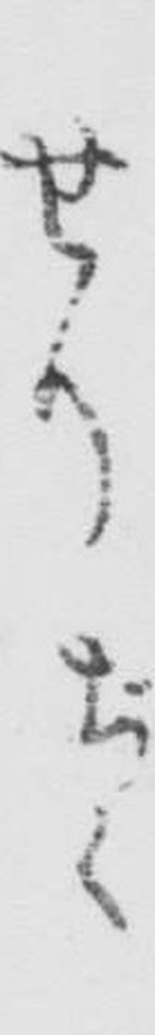せりぢく
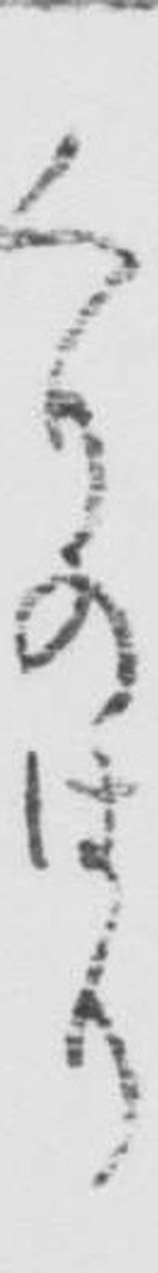くりのはり
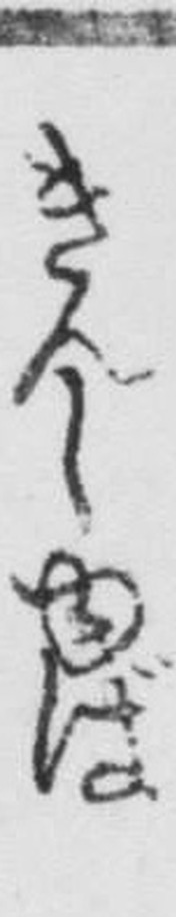きんしゆば
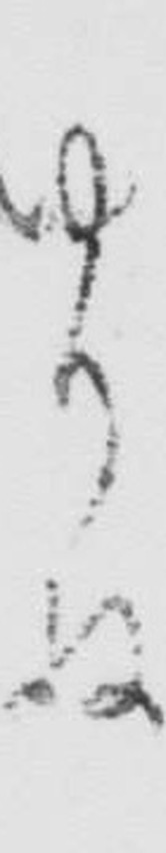ゆりね
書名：諸家通用/即席料理
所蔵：大阪府立大学学術情報センター 国文学研究資料館
